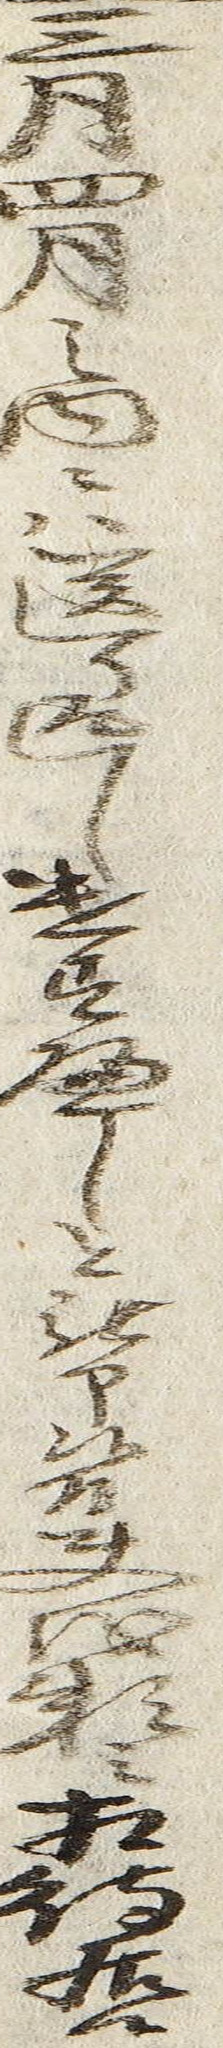三月四月之内には送り返し遣すへしと被申候付夫を頼み相待居候
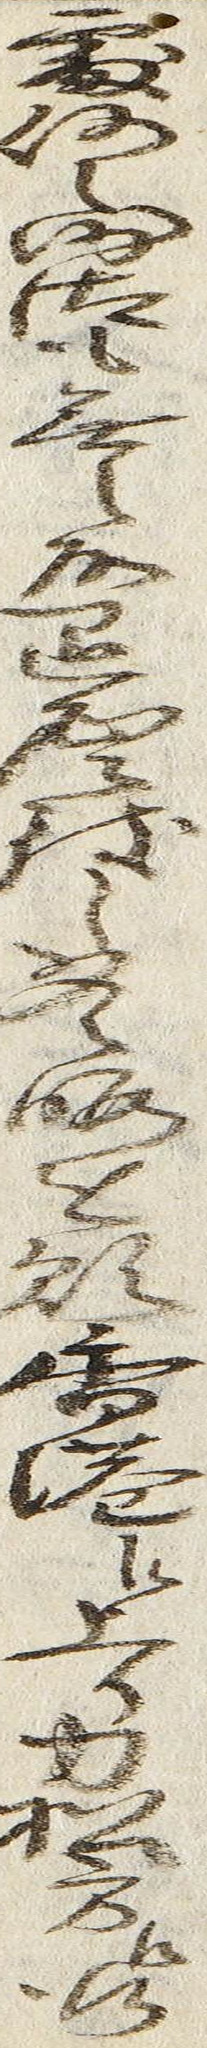処何之沙汰も無之故退屈致し少ヵ々暇を願香港江上り力松方江行
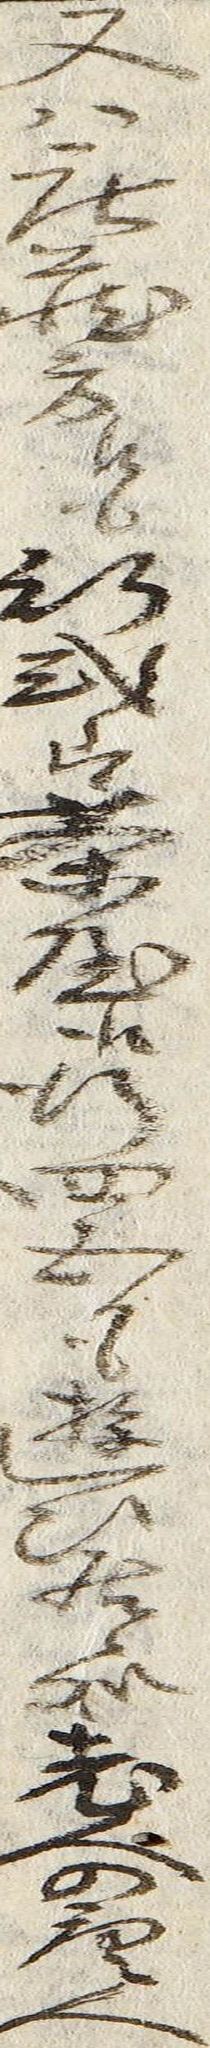又は庄蔵方江も行或は茶屋江行四五日も遊ひ居候処老人の唐人
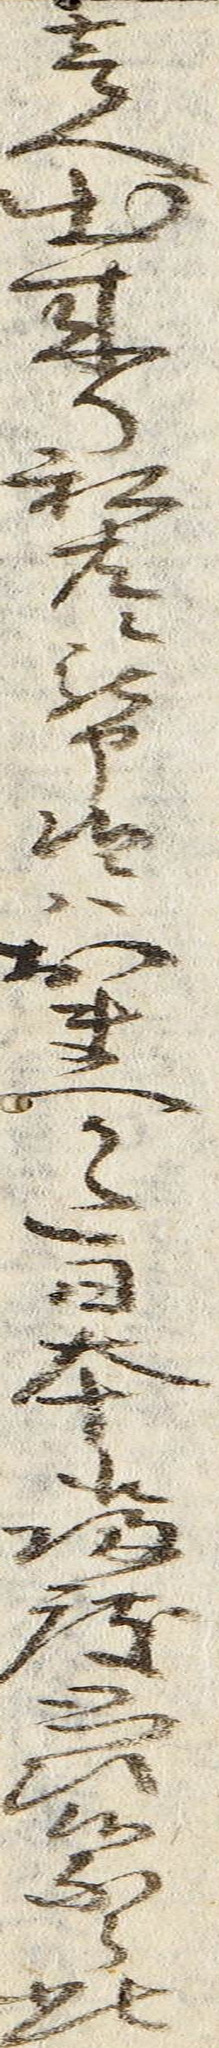壱人出来り私共に被申候にはおまへかた日本江帰度思ひ候なら此
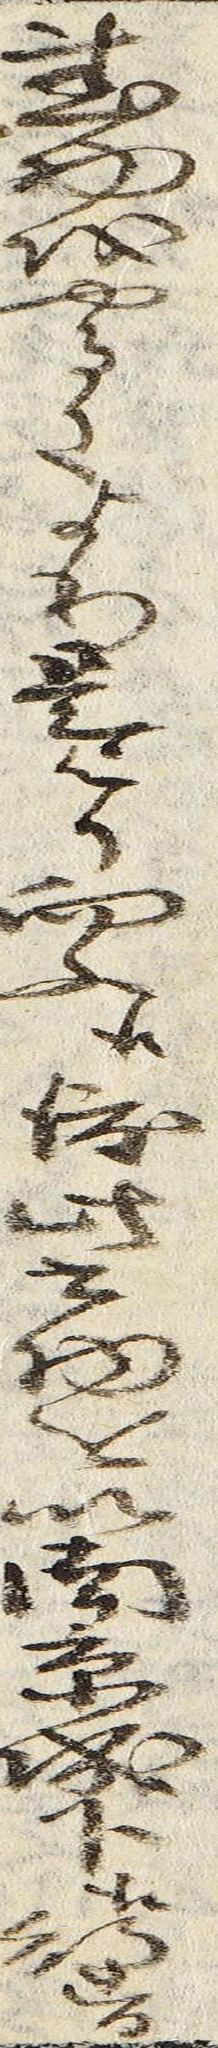書物をやるにより是より向ふ江渡此書物を以南京城下江行れる
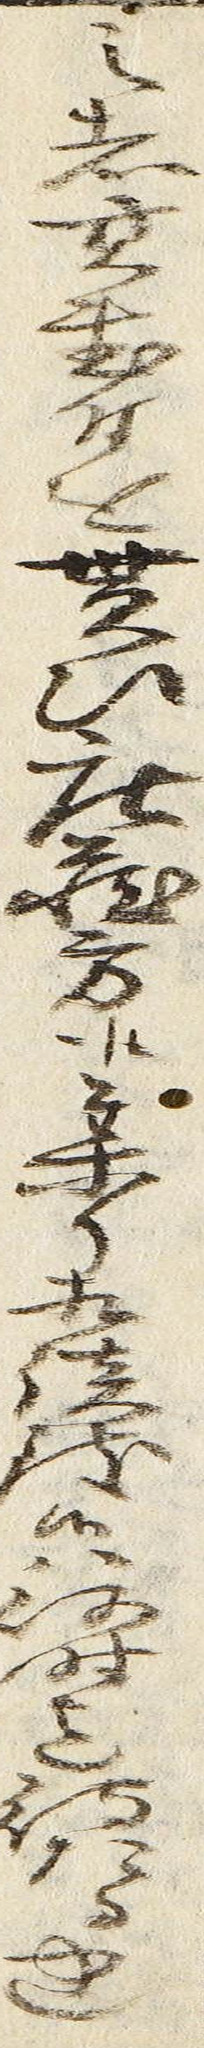之者共書付を貰ひ庄蔵方江参り相談致候は何時迄待たる迚
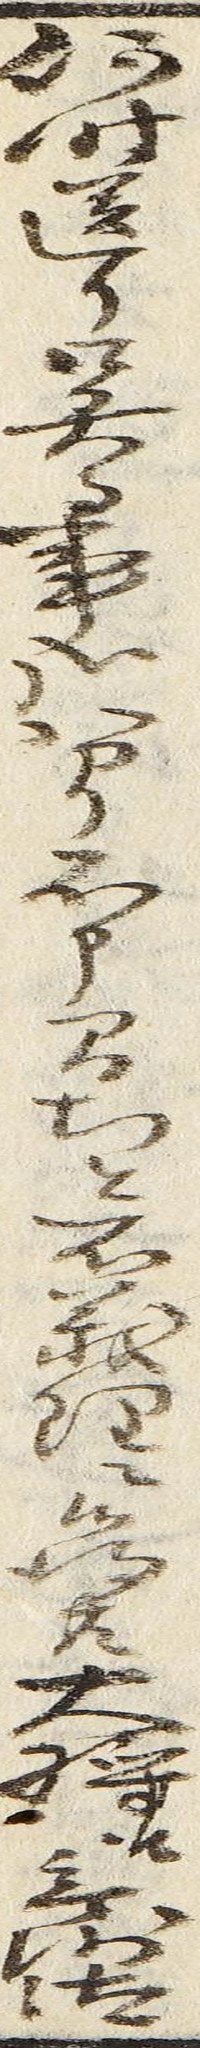何時送り呉る事哉はかり不申間ちと不義理に候得共大将江無沙汰
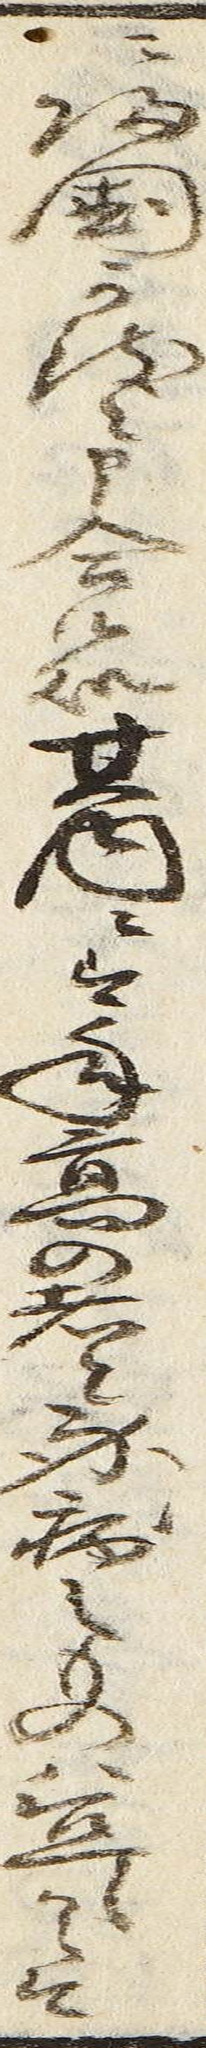に帰国可致と申合候処其内には年高の者と身病之ものは宜しからす
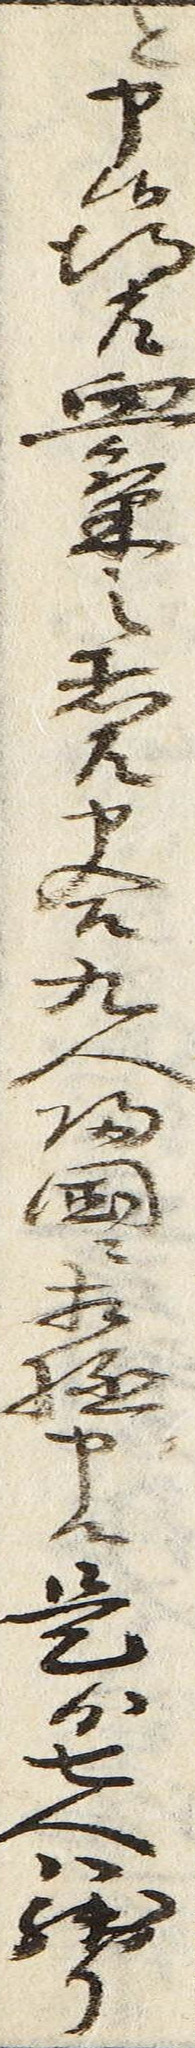と申候得共血気之者共申合九人帰国に相極申候是ゟ七人は残り
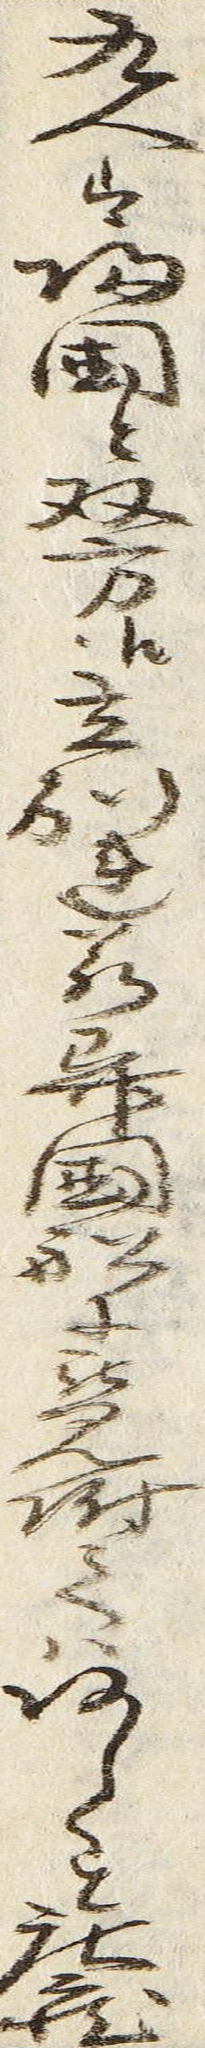九人は帰国と双方江立別れ若異国船に被見附てはあしくと庄蔵
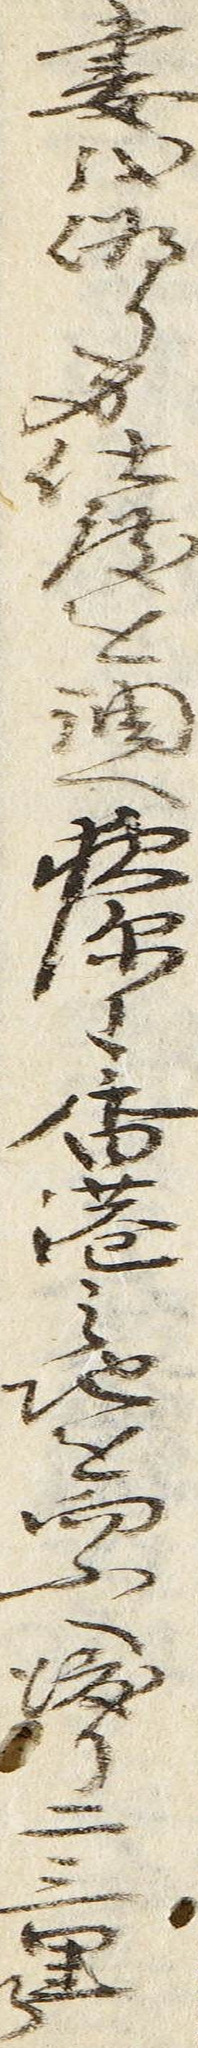妻を偽り身仕度を調へ夜深に香港之地を向ふへ渡り二三里行
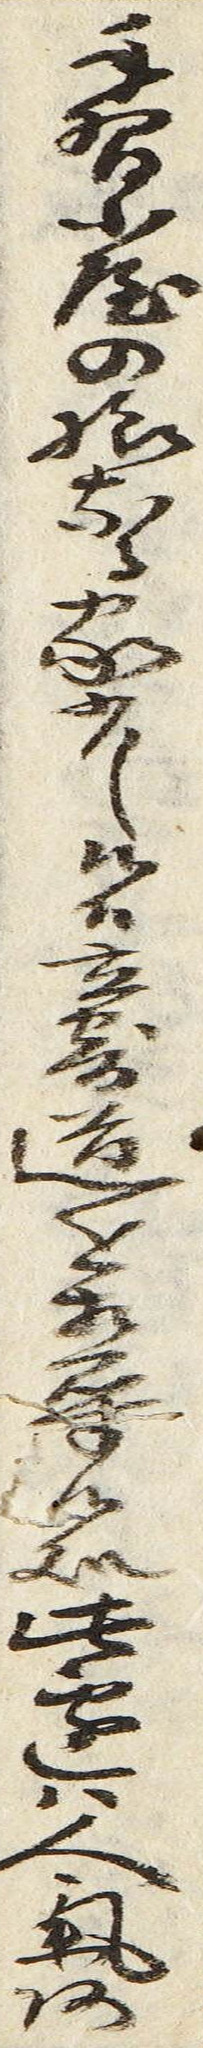手習小屋の様なる家有之候付立寄道を相尋候処此辺は人気あ
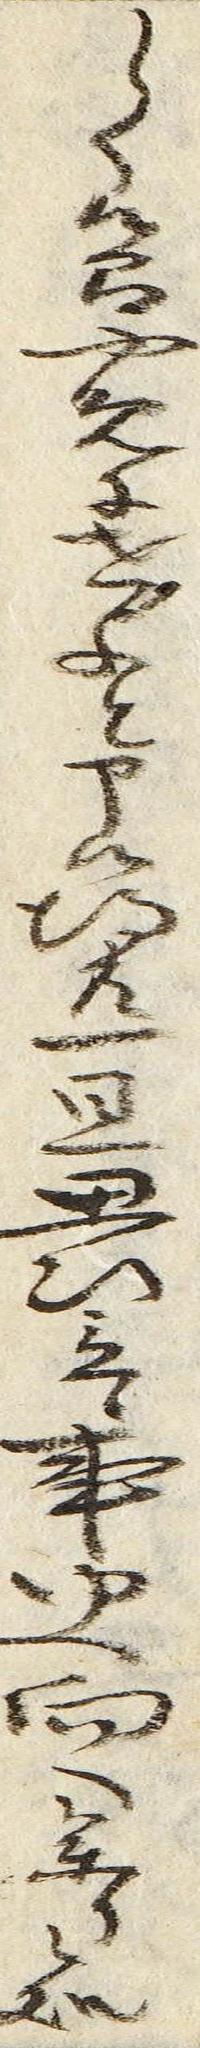しく候間やめにせよと申候得共一旦思ひ立候事ゆへ向へ参り候処
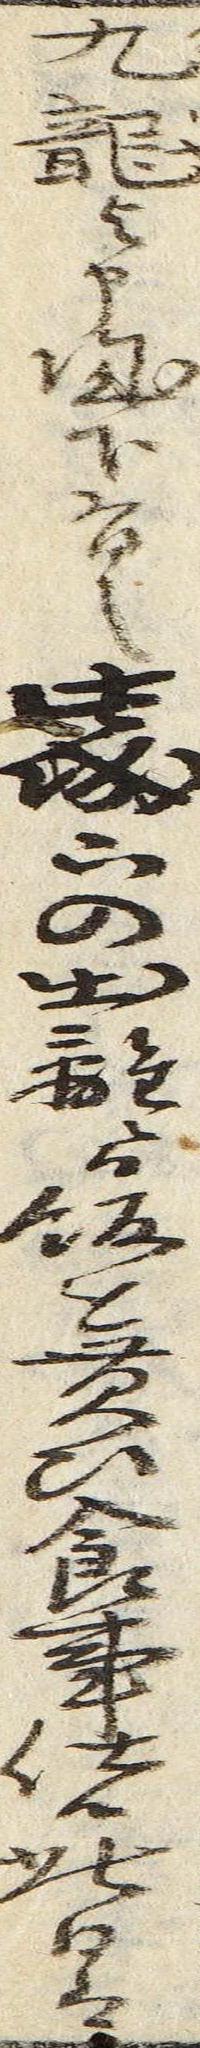九龍と申城下有之此城下の出離に而飯を貰ひ食事仕候此日は

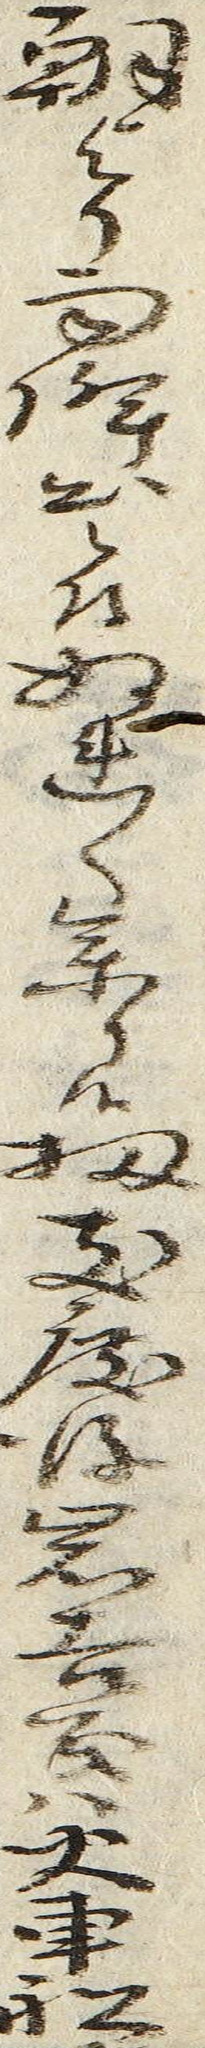朝より雨降出候付ぬれ〳〵参り候扨支度後岩吉義は火車船
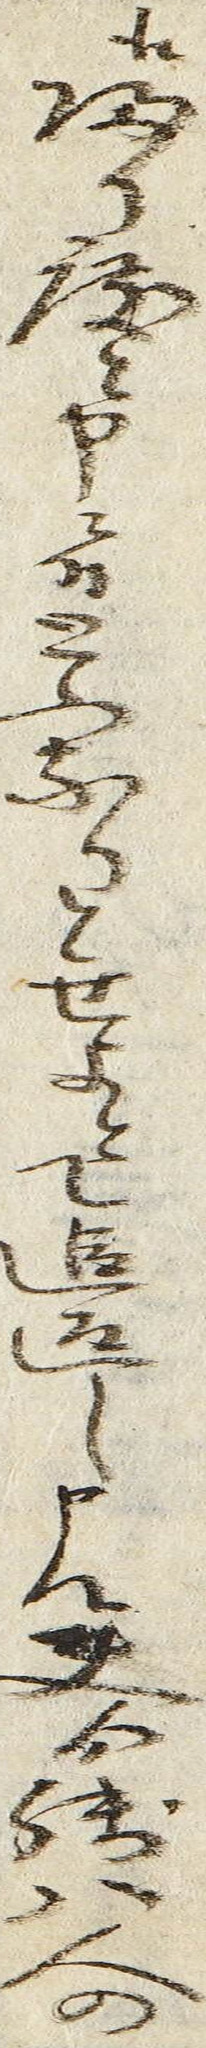江帰り度と申に付とふなりとせよとて追返し申候夫ゟ残八人の
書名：漂流夢物語
